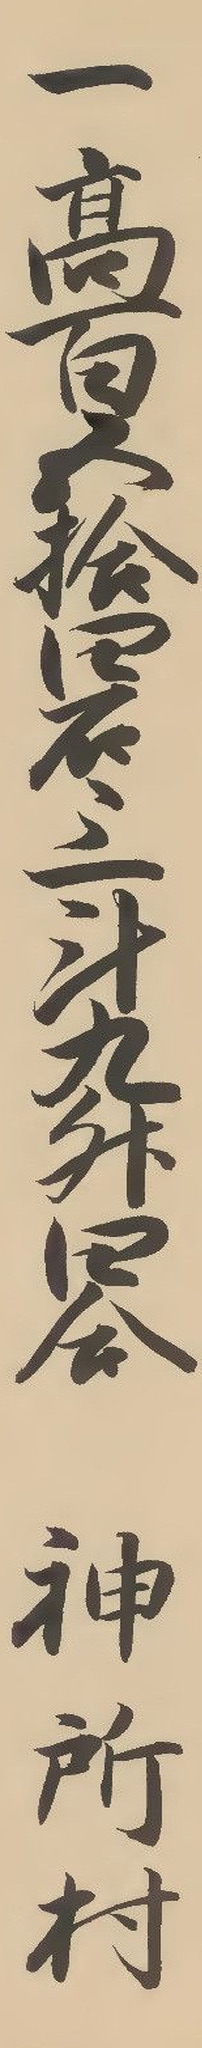一高百五拾四石三斗九升四合神所村
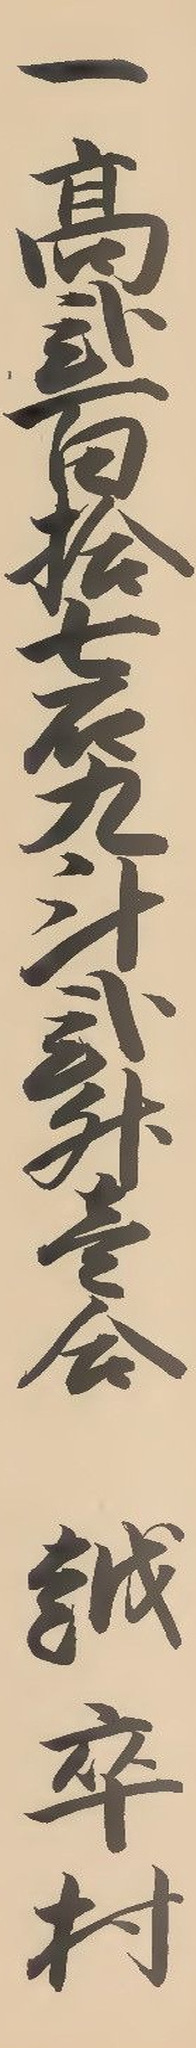一高弐百拾七石九斗弐升壱合越卒村
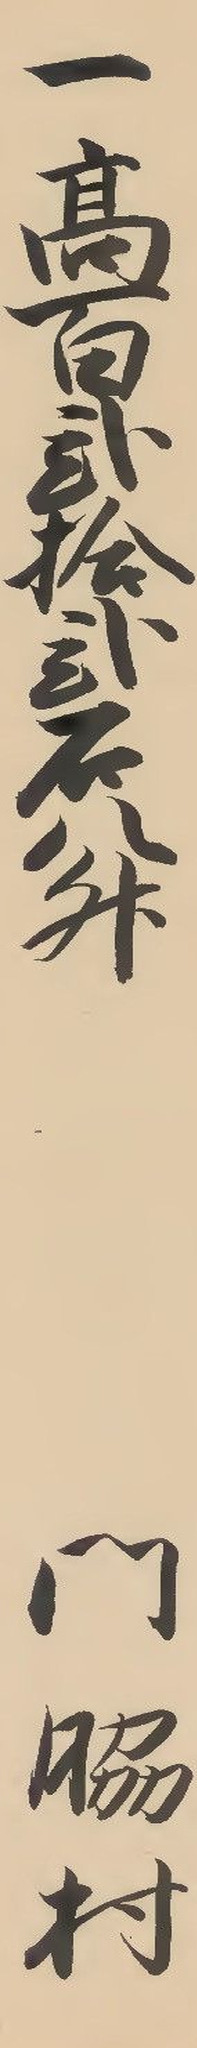一高百弐拾弐石八升門脇村
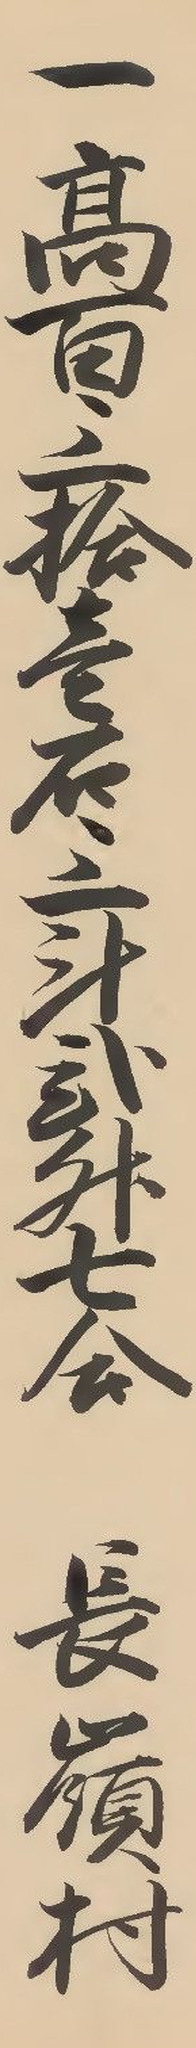一高百三拾壱石三斗弐升七合長嶺村
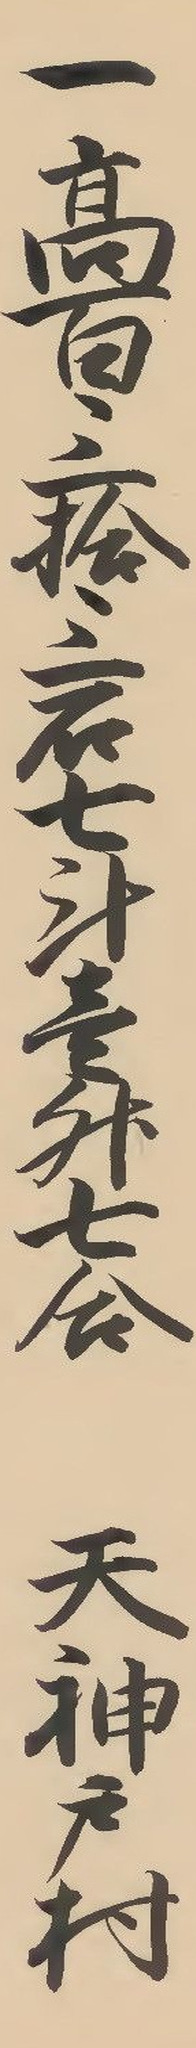一高百三拾三石七斗壱升七合天神戸村

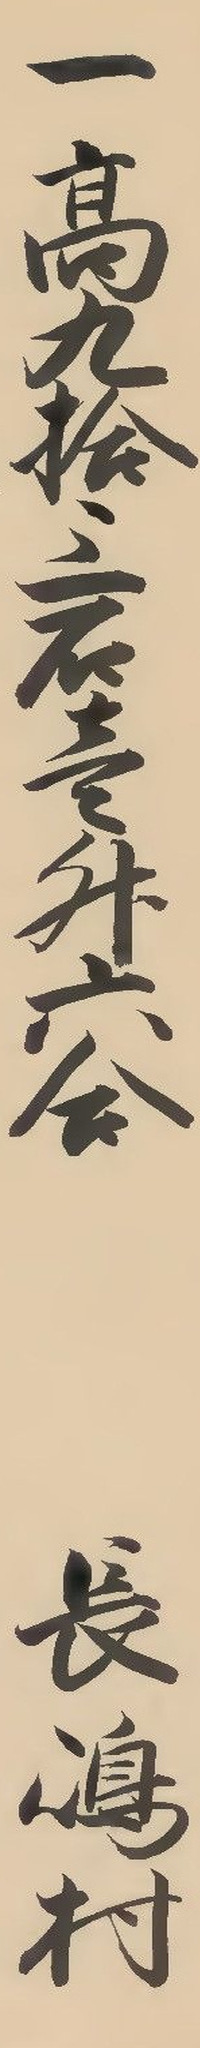一高九拾三石壱升六合長島村
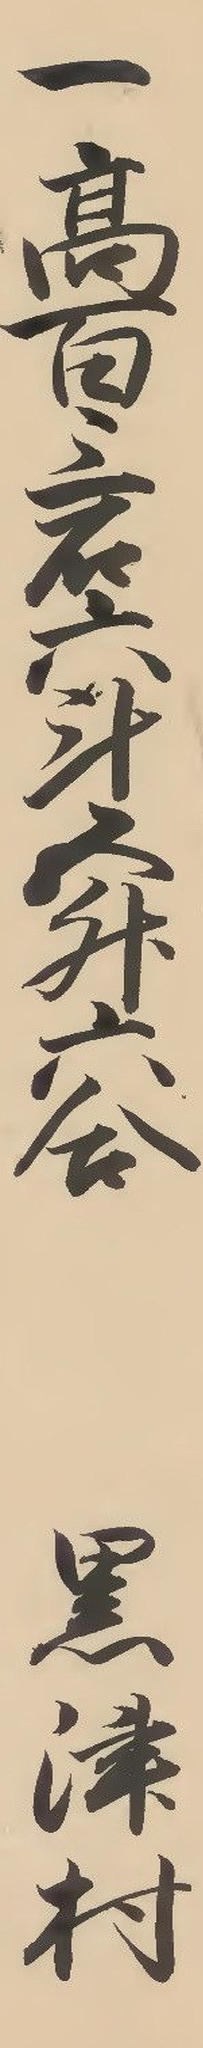一高百三石六斗五升六合黒津村
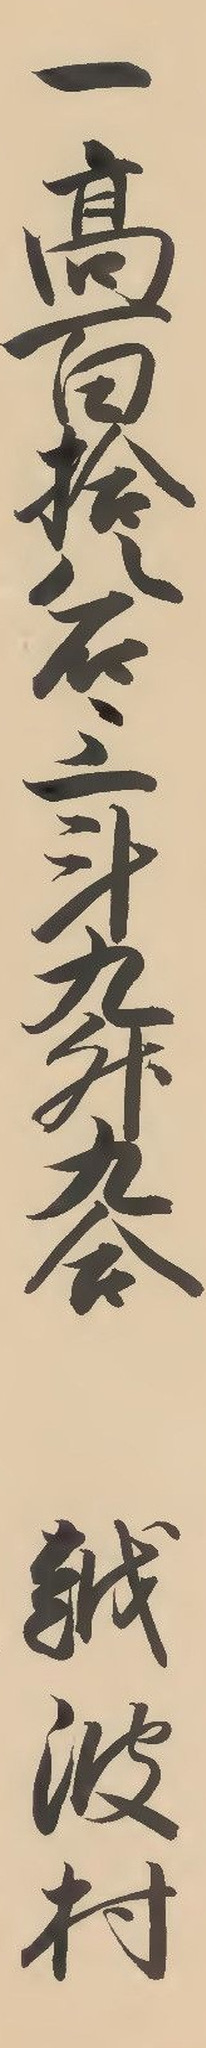一高百拾八石三斗九升九合越波村
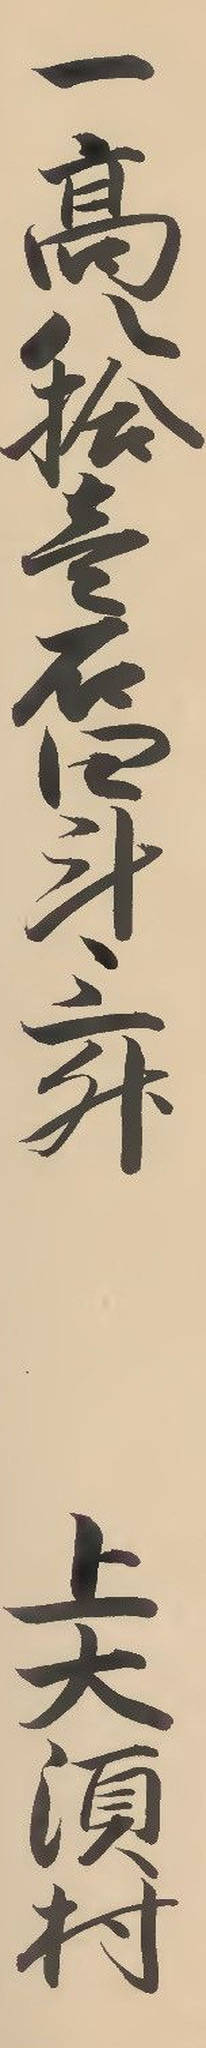一高八拾壱石四斗三升上大須村
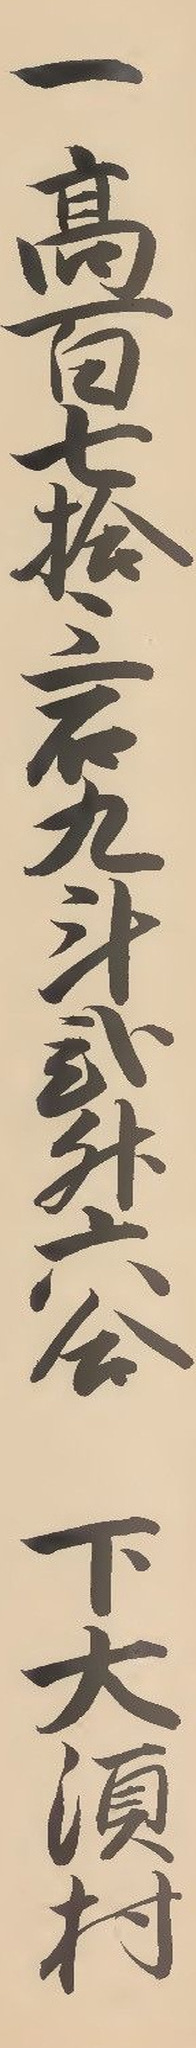一高百七拾三石九斗弐升六合下大須村
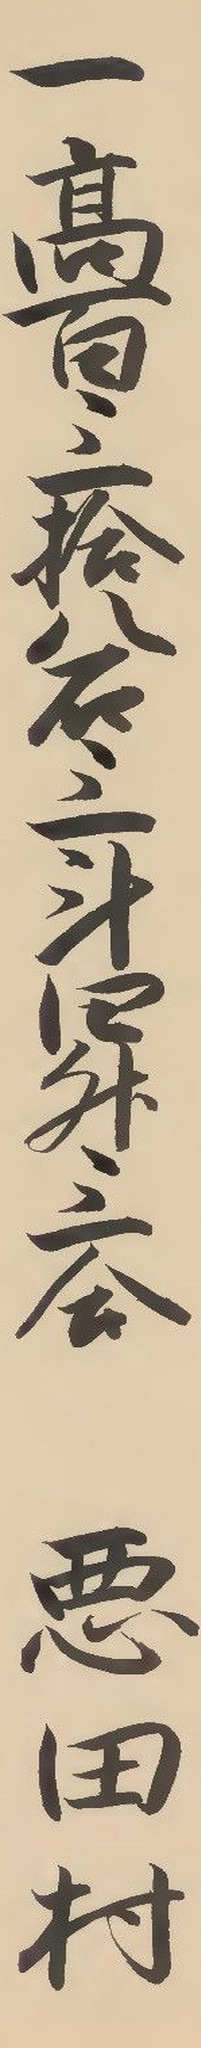一高百三拾八石三斗四升三合悪田村
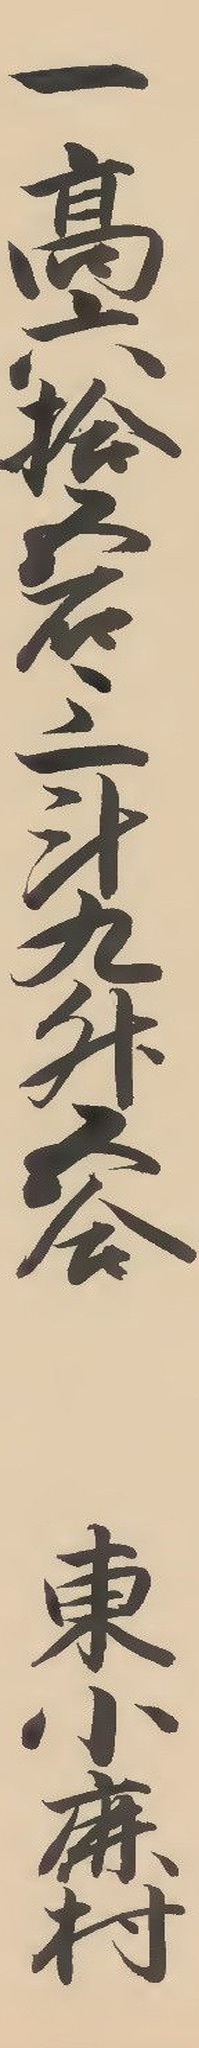一高六拾五石三斗九升五合東小鹿村
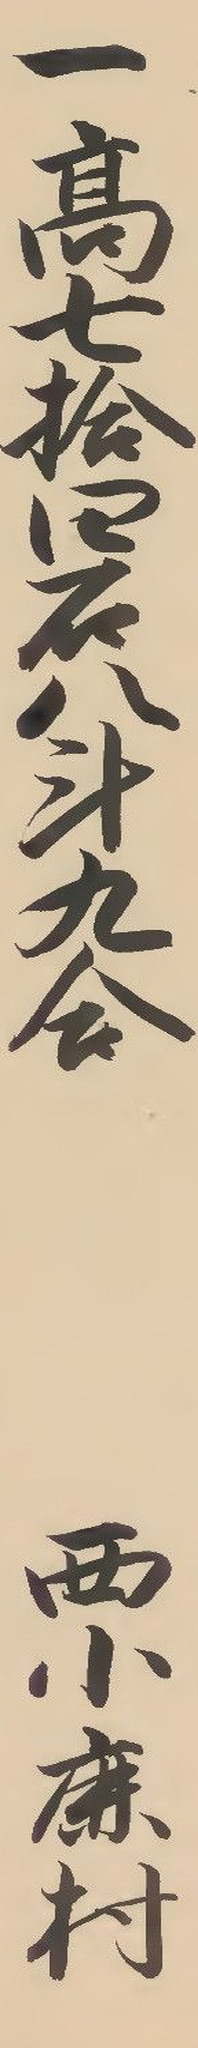一高七拾四石八斗九合西小鹿村

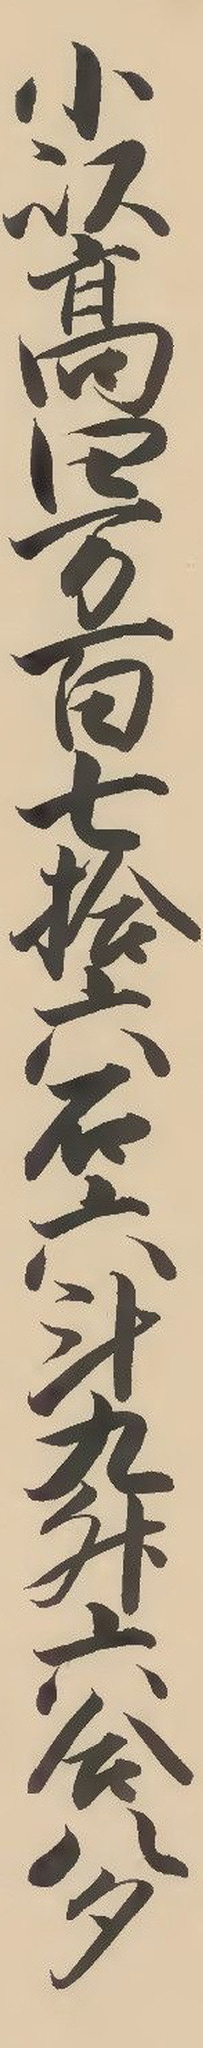小以高四万百七拾六石六斗九升六合八勺
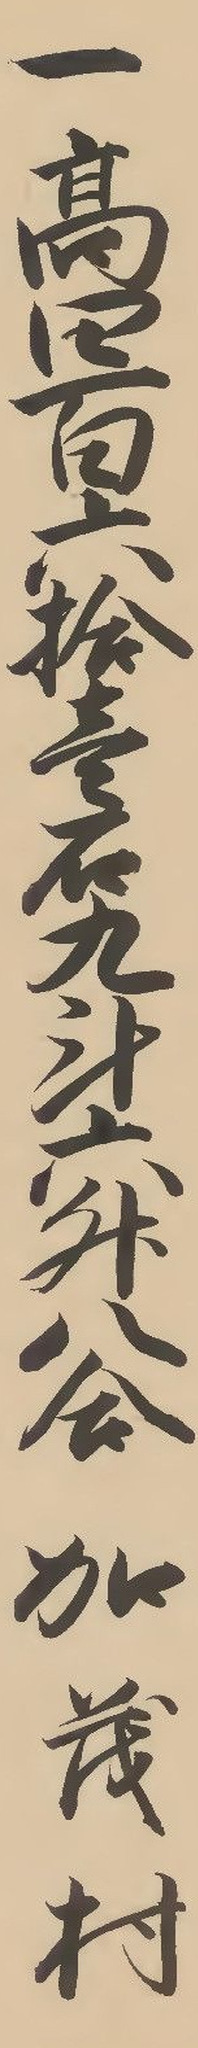一高四百六拾壱石九斗六升八合加茂村
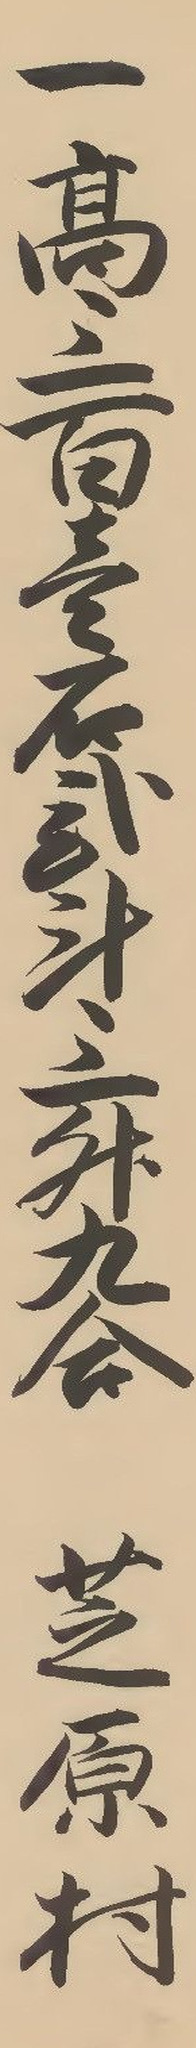一高三百壱石弐斗三升九合芝原村
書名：美濃国郷帳
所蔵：国立公文書館 National Archives of Japan
